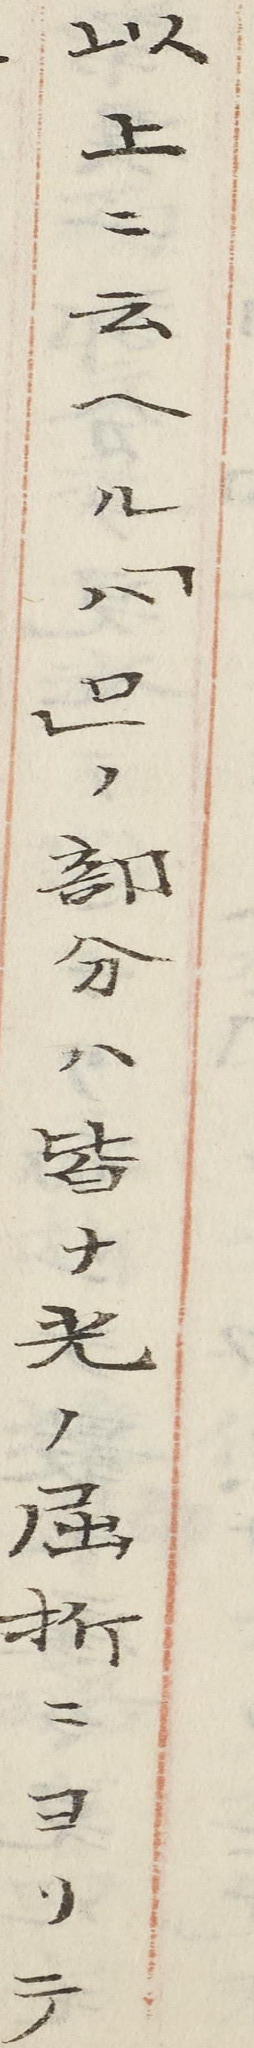以上ニ云ヘル「ハロ」ノ部分ハ皆ナ光ノ屈折ニヨリテ
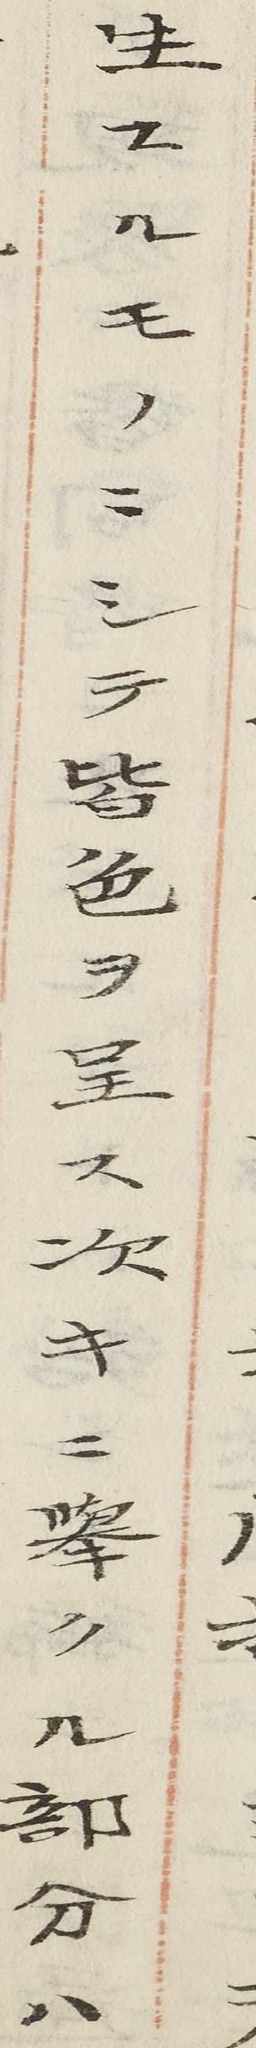生スルモノニシテ皆色ヲ呈ス次キニ挙クル部分ハ
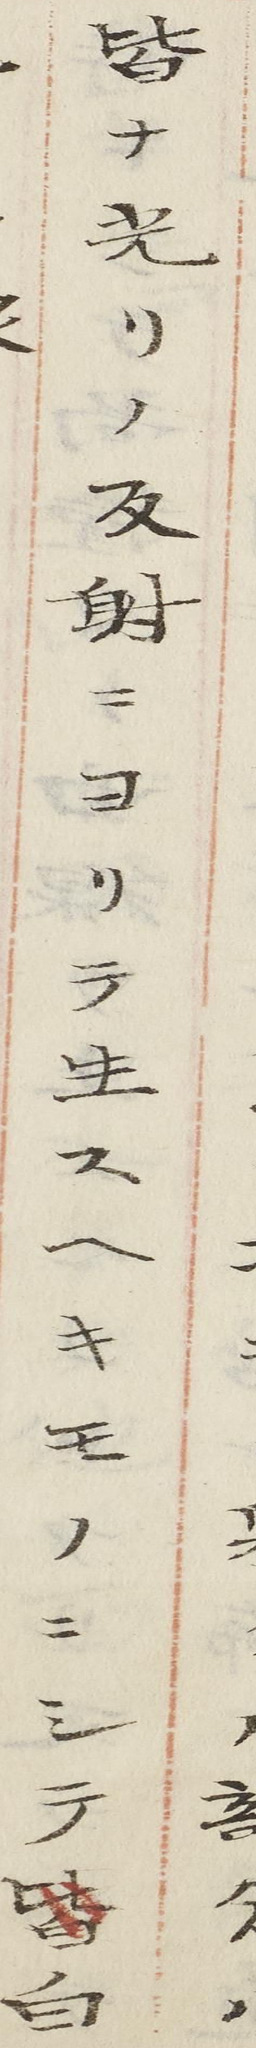皆ナ光ノ反射ニヨリテ生スヘキモノニシテ皆白
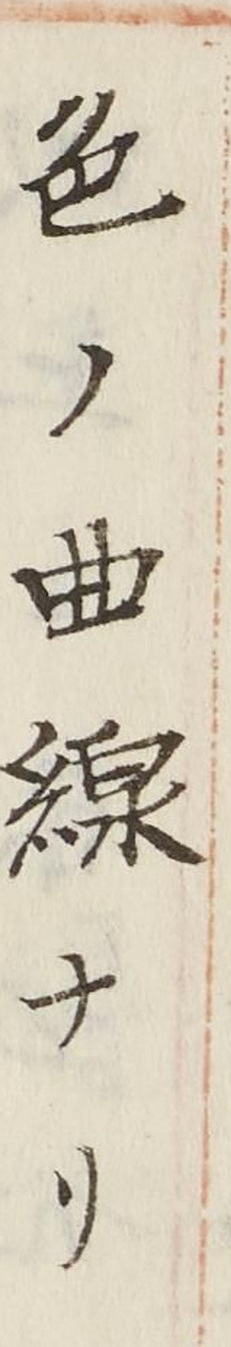色ノ曲線ナリ
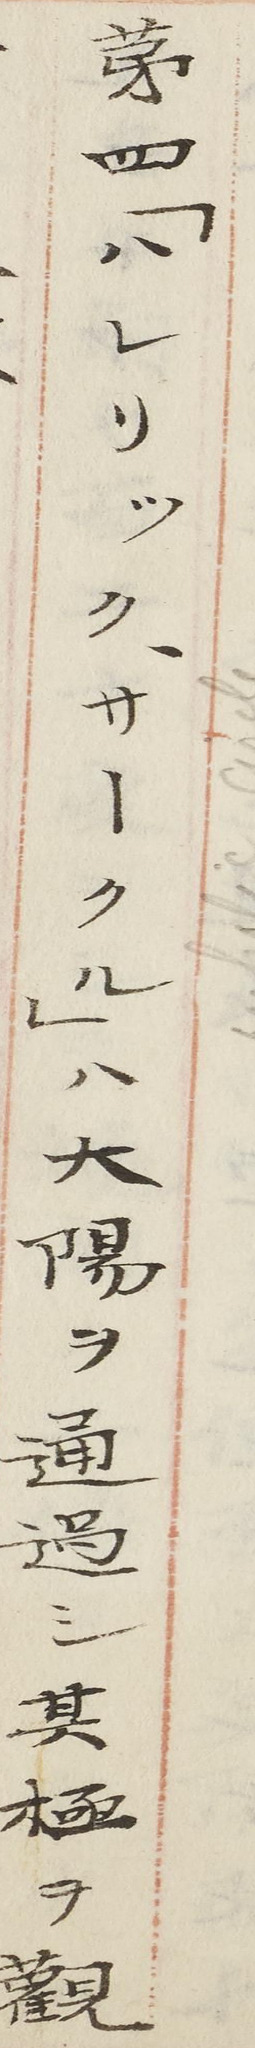第四「ハレリック、サークル」ハ大陽ヲ通過シ其極ヲ観
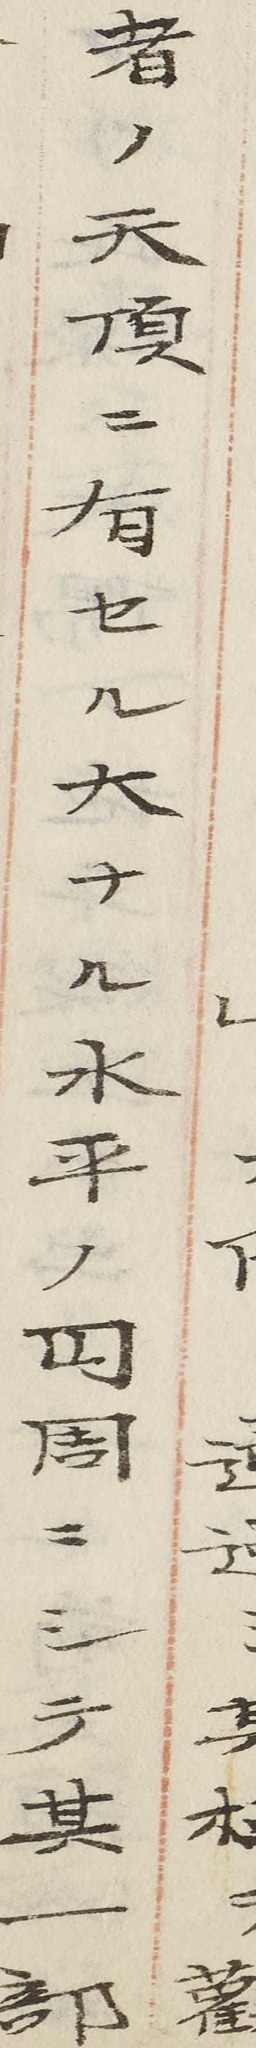者ノ天頂ニ有セル大ナル水平ノ円周ニシテ其一部
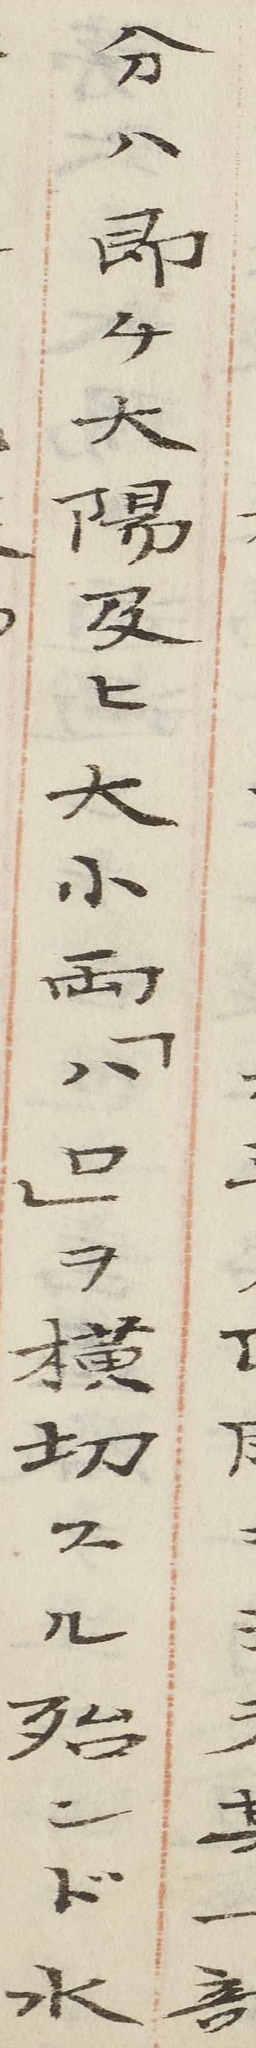分ハ即チ大陽及ヒ大小両「ハロ」ヲ横切スル殆ンド水
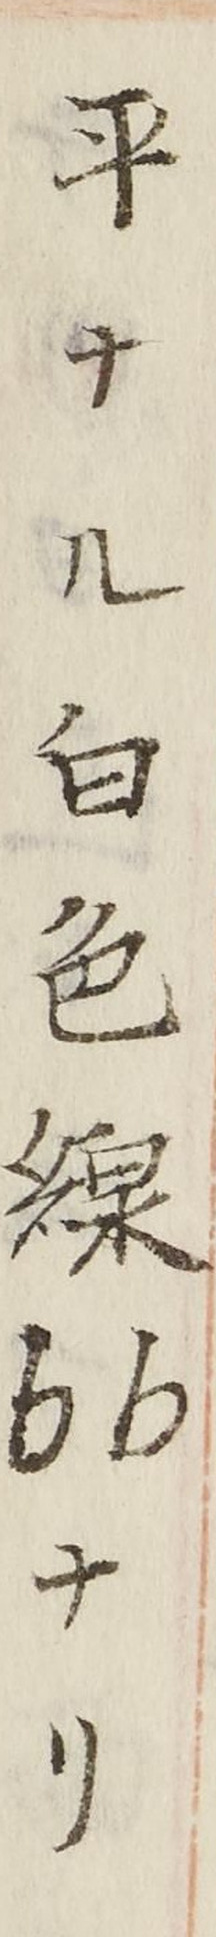平ナル白色線ｂｂナリ
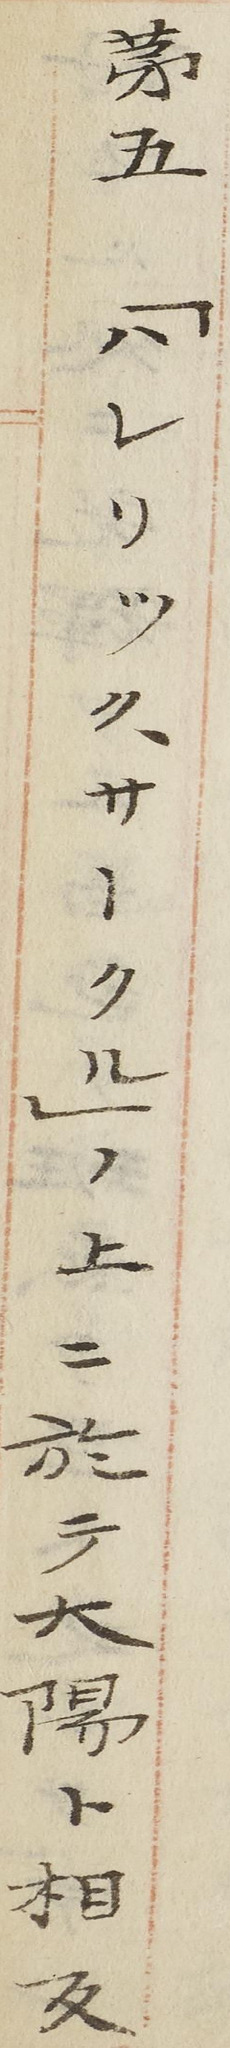第五「ハレリック、サークル」ノ上ニ於テ大陽ト相反

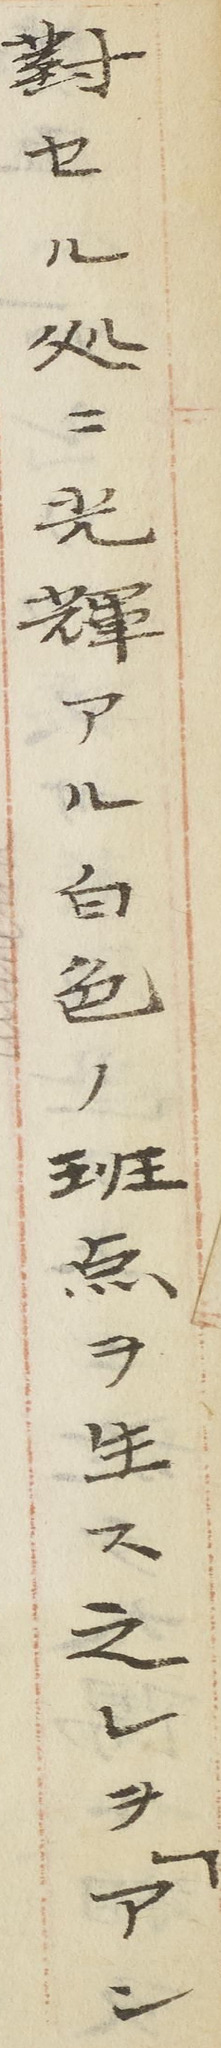対セル処ニ光輝アル白色ノ斑点ヲ生ス之レヲ「アン
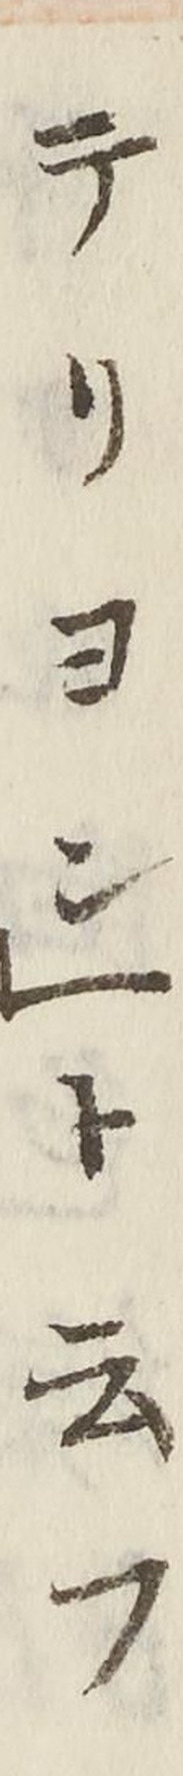テリヨン」ト云フ
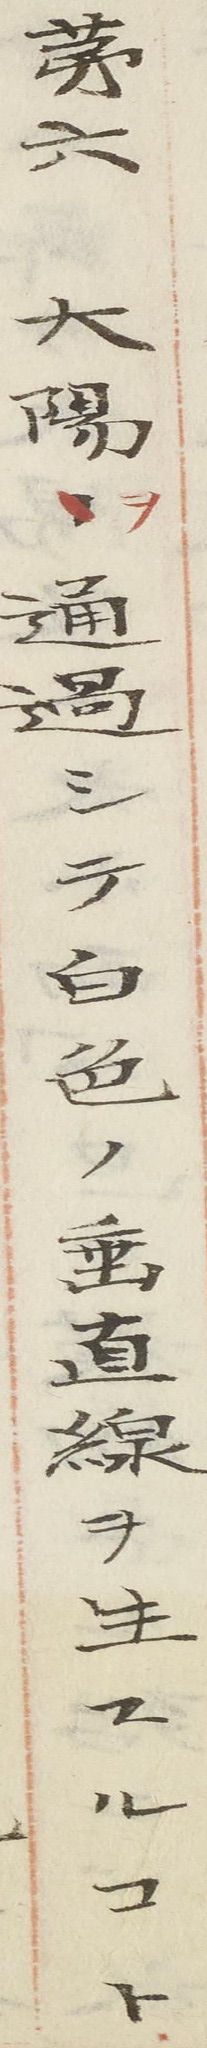第六大陽ノ通過シテ白色ノ垂直線ヲ生スルコト
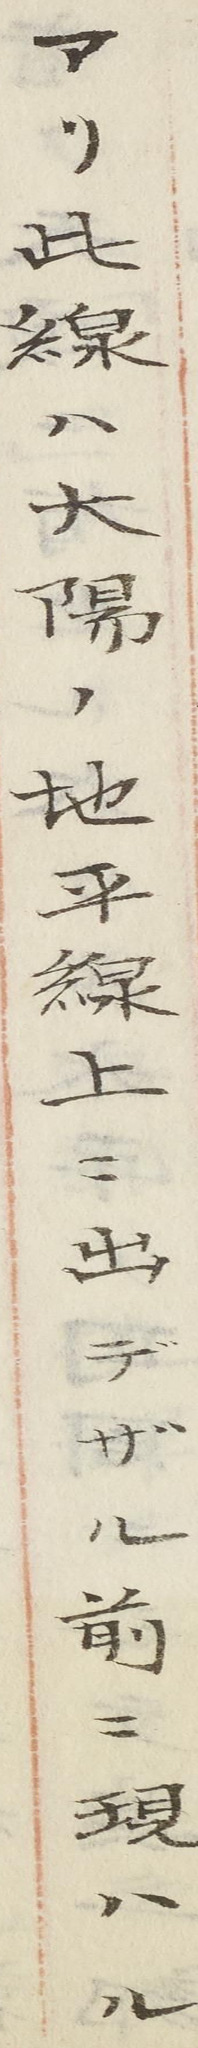アリ此線ハ大陽ノ地平線上ニ出デザル前ニ現ハル
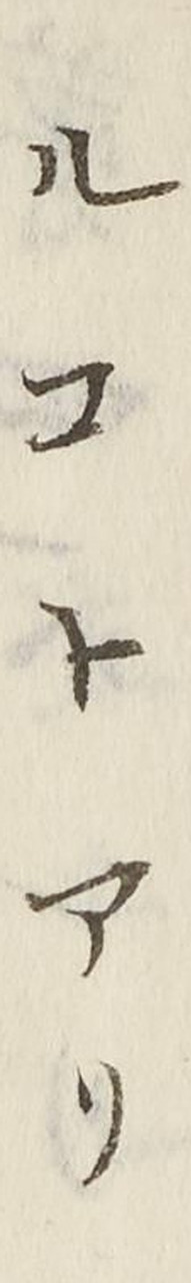ルコトアリ
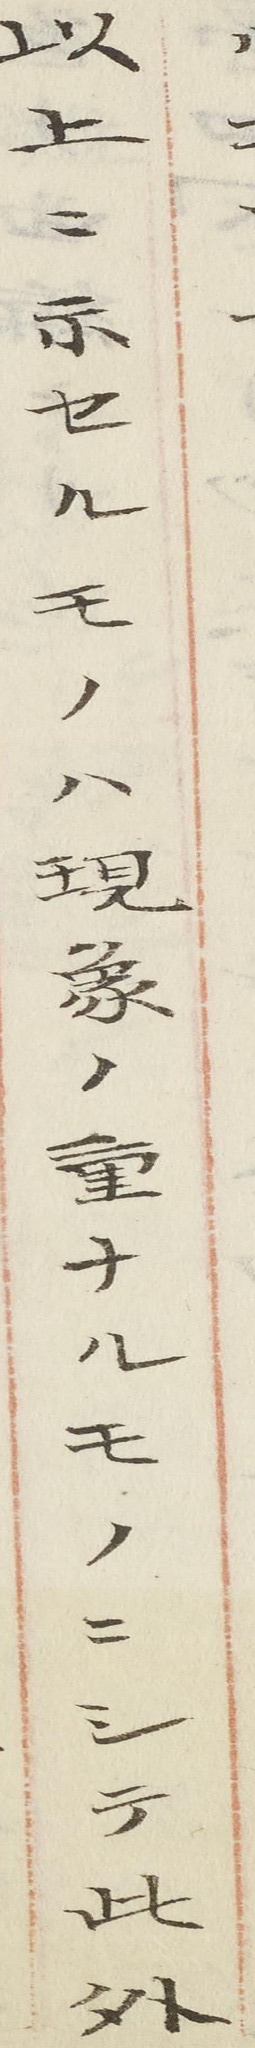以上ニ示セルモノハ現象ノ重ナルモノニシテ此外
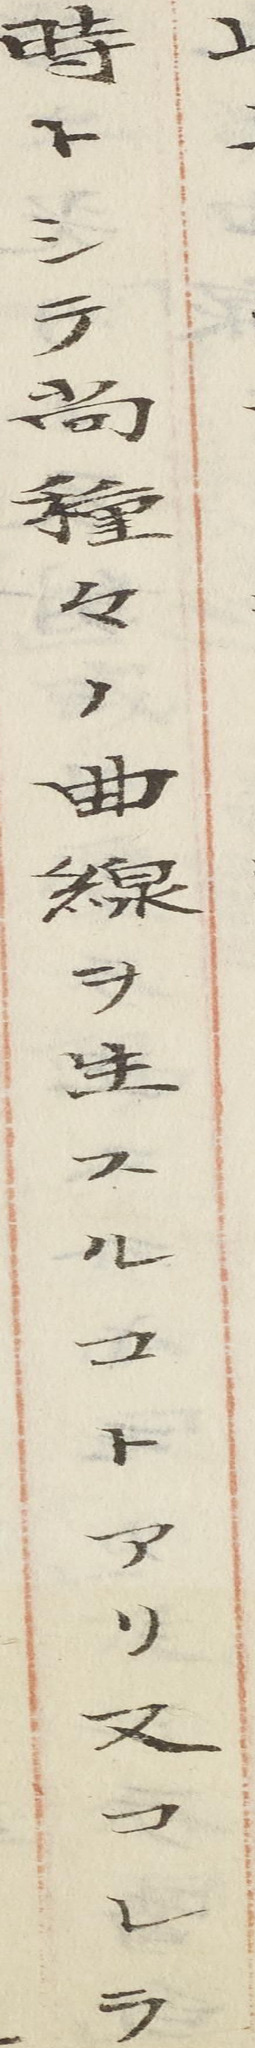時トシテ尚種々ノ曲線ヲ生スルコトアリ又コレラ
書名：虹及ハロノ説明
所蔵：東京大学地震研究所図書室 Earthquake Research Institute Library, The University of Tokyo, JAPAN
